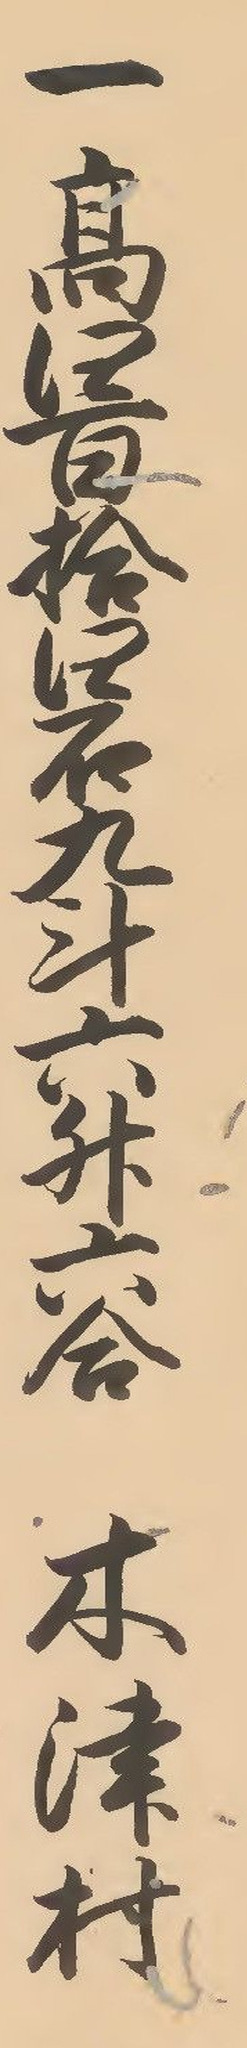一髙四百拾四石九斗六升六合木津村
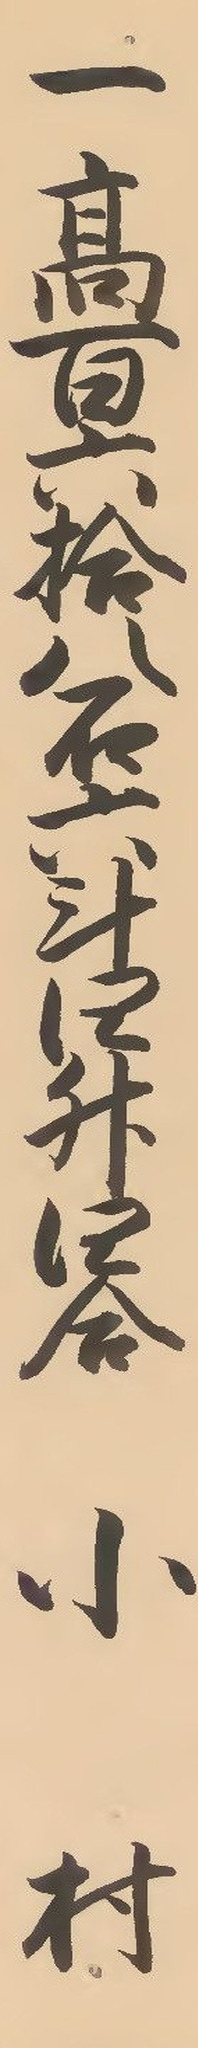一髙百六拾八石六斗四升四合小村
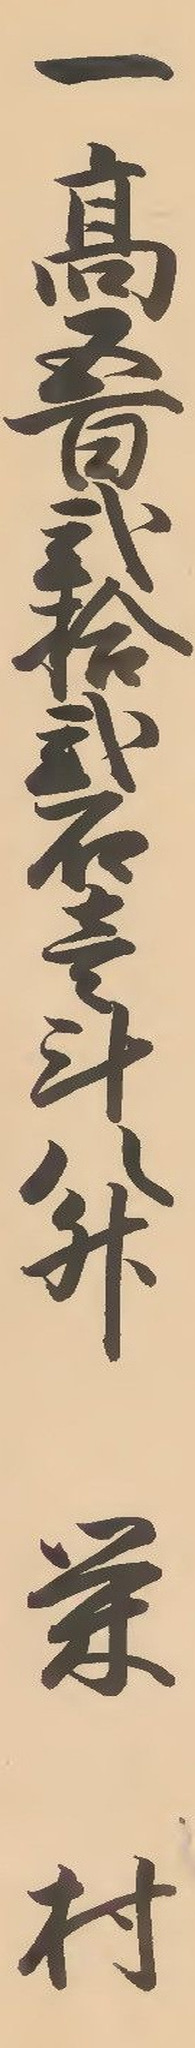一髙五百弐拾弐石壱斗八升栄村
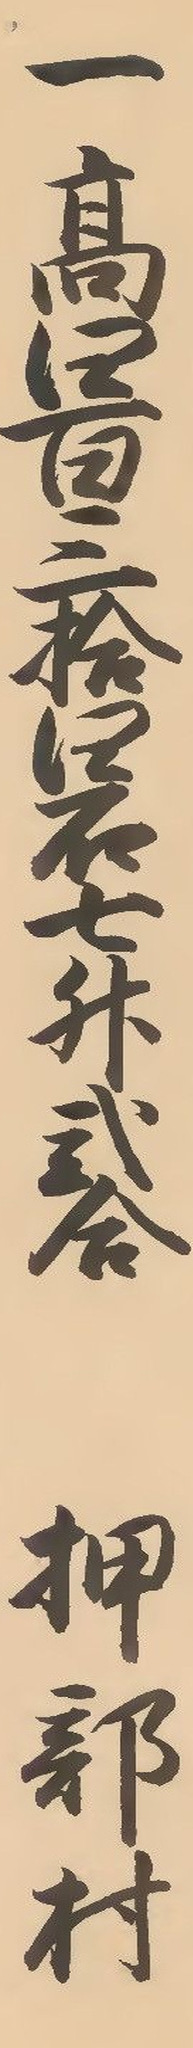一髙四百三拾四石七升弐合押部村
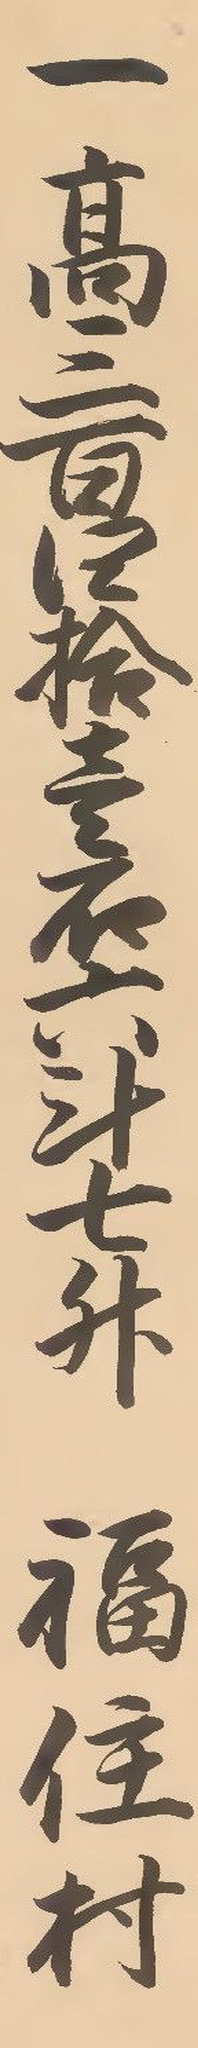一髙三百四拾壱石六斗七升福住村
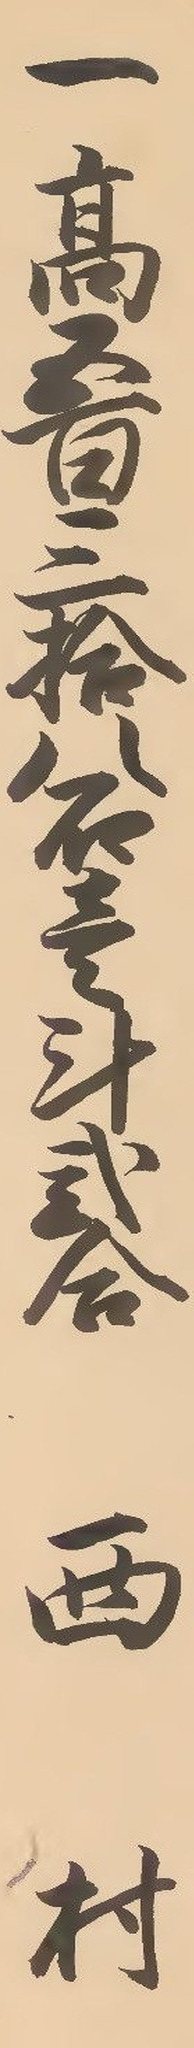一髙五百三拾八石壱斗弐合西村
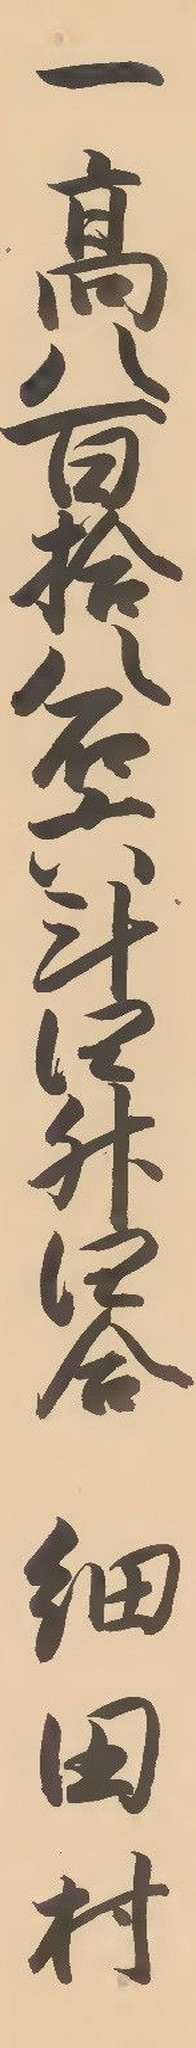一髙八百拾八石六斗四升四合細田村
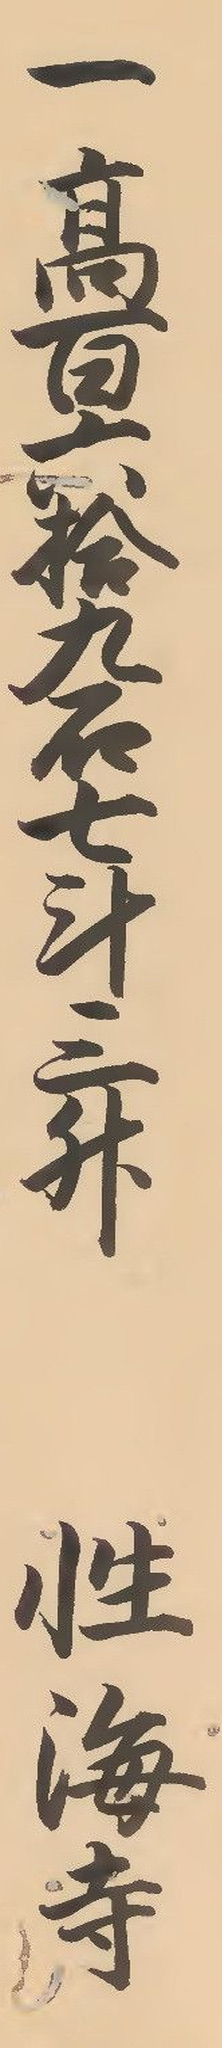一髙百六拾九石七斗三升性海寺

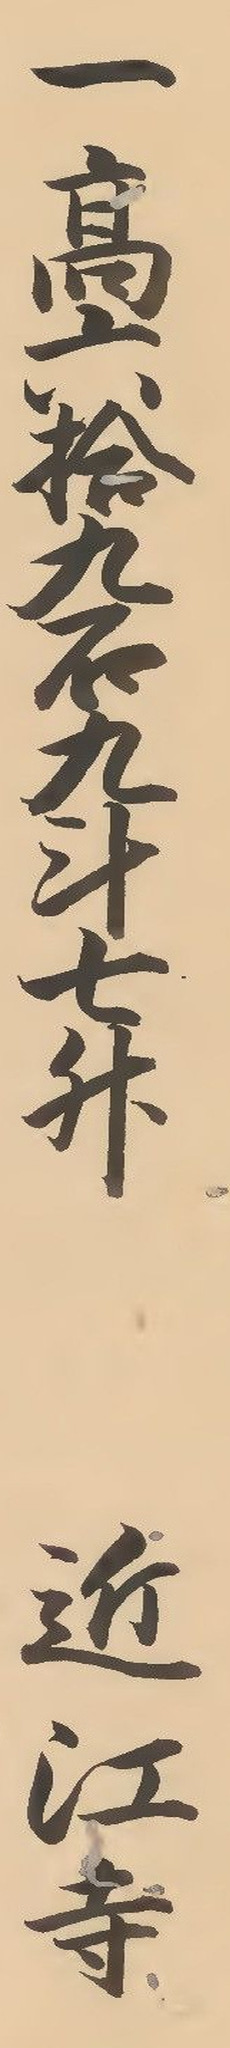一髙六拾九石九斗七升近江寺
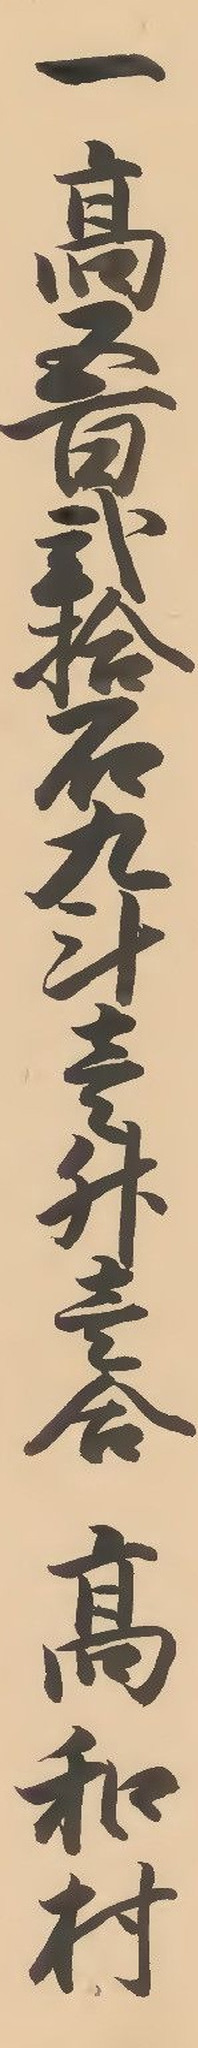一髙五百弐拾石九斗壱升壱合髙知村
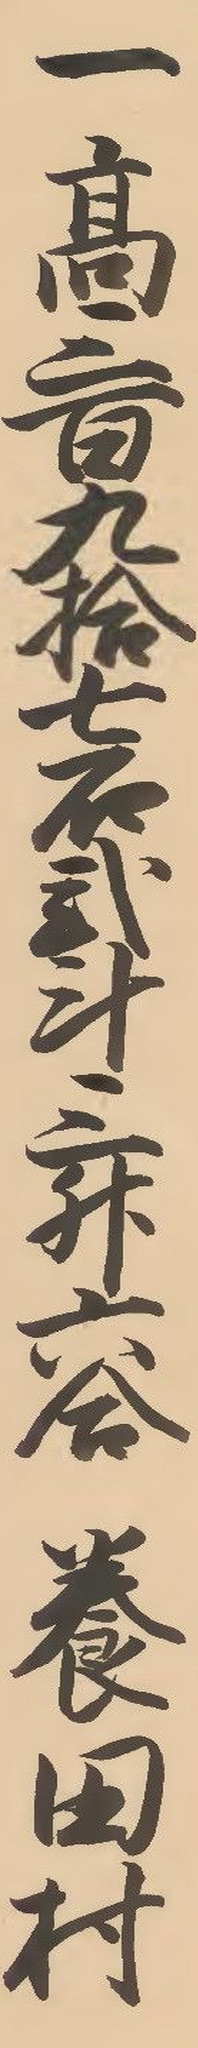一髙三百九拾七石弐斗三升六合養田村
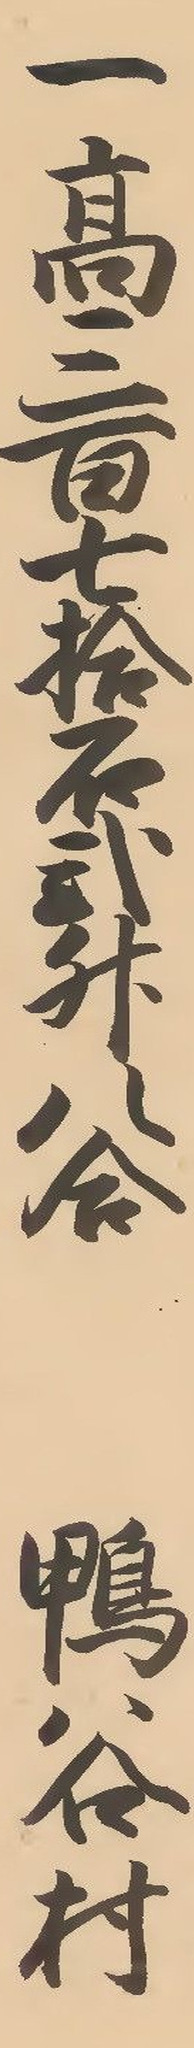一髙三百七拾石弐升八合鴨谷村
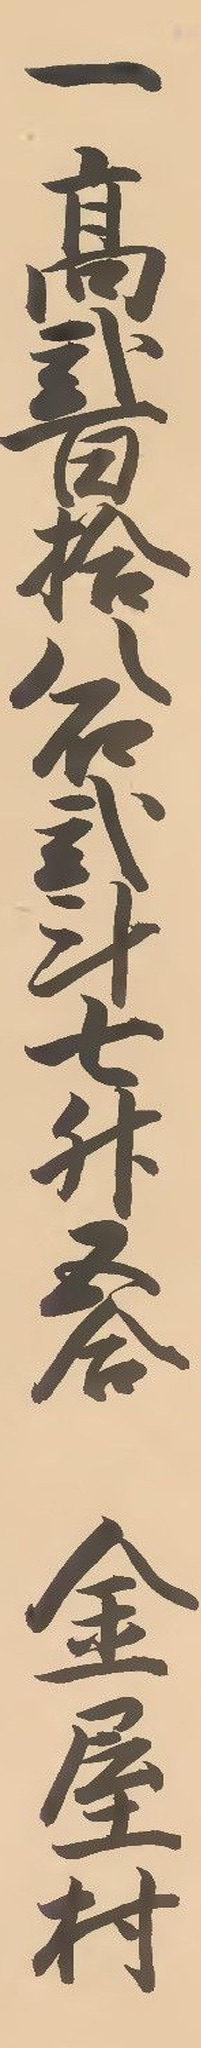一髙弐百拾八石弐斗七升五合金屋村
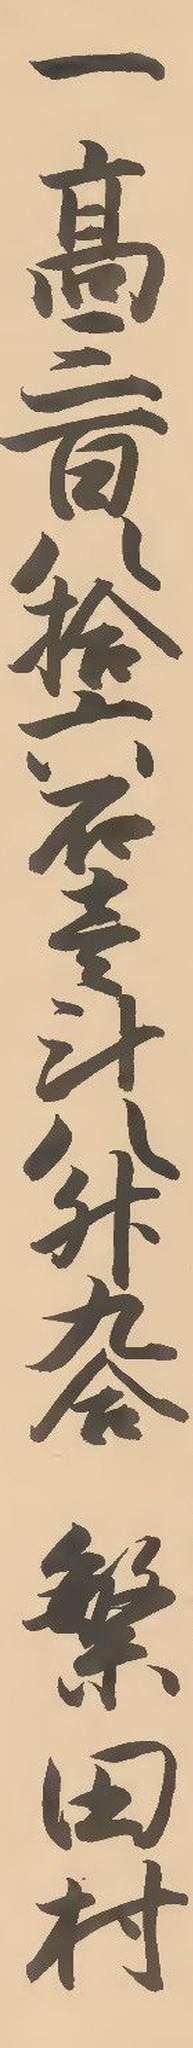一髙三百八拾六石壱斗八升九合繁田村
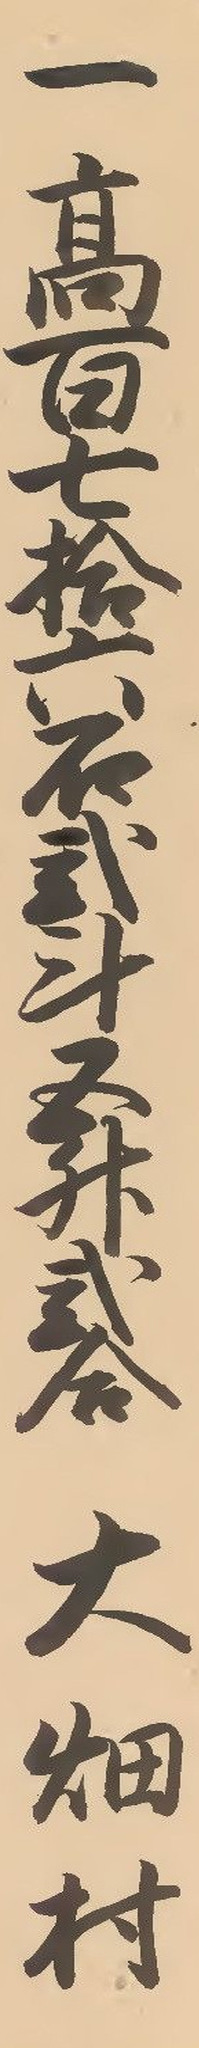一髙百七拾六石弐斗五升弐合大畑村
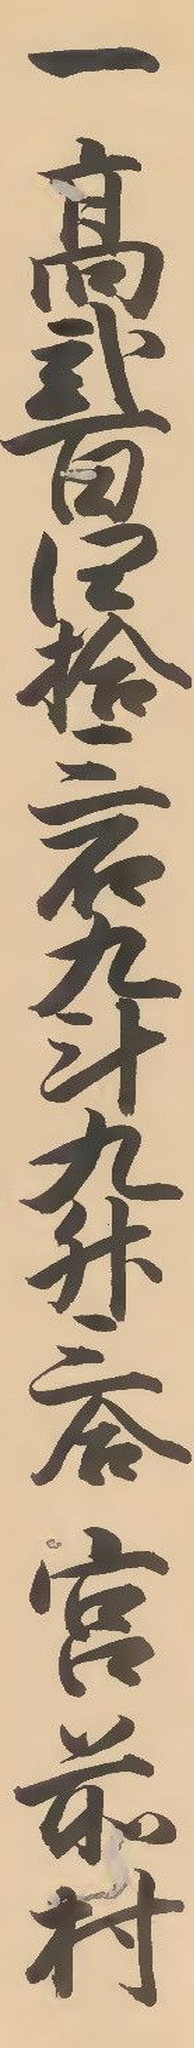一髙弐百四拾三石九斗九升三合宮前村
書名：播磨国郷帳
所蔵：国立公文書館 National Archives of Japan
